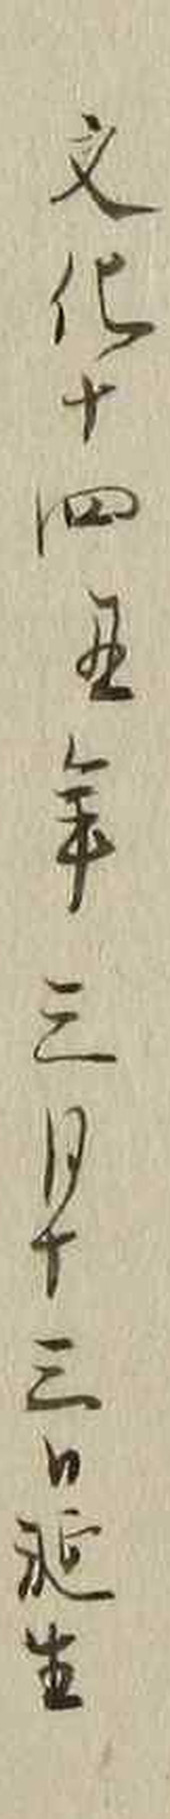女菊文化十四丑年三月十三日誕生
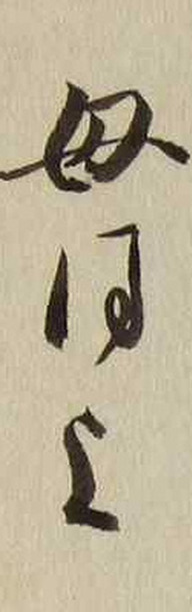母同上
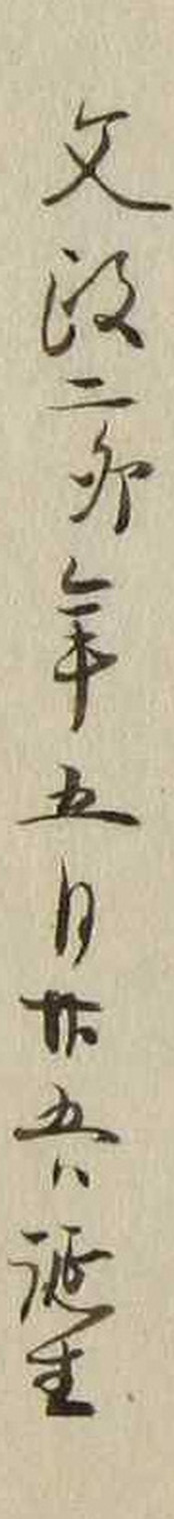留吉文政二卯年五月廿五日誕生
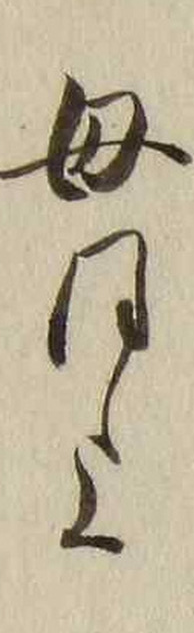母同上
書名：諸士系譜　巻之103　か之部11
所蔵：会津若松市立会津図書館
